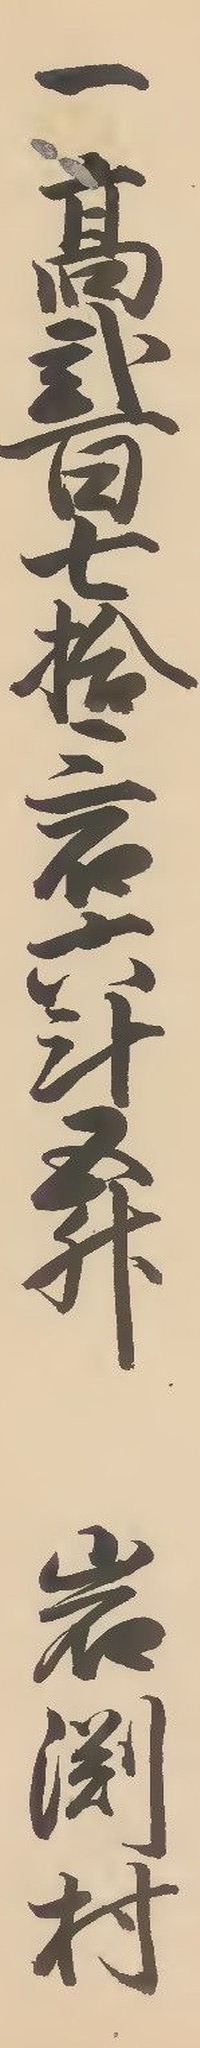一高弐百七拾三石六斗五升岩淵村

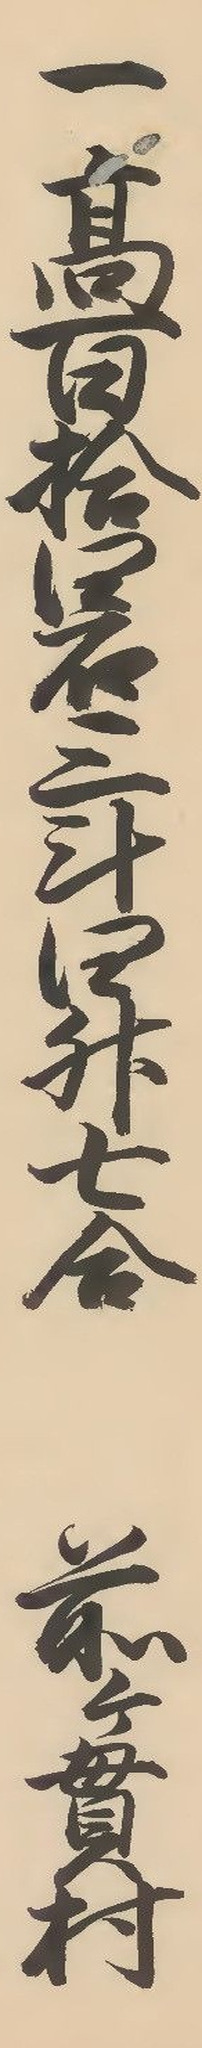一高百拾四石三斗四升七合前ヶ貫村
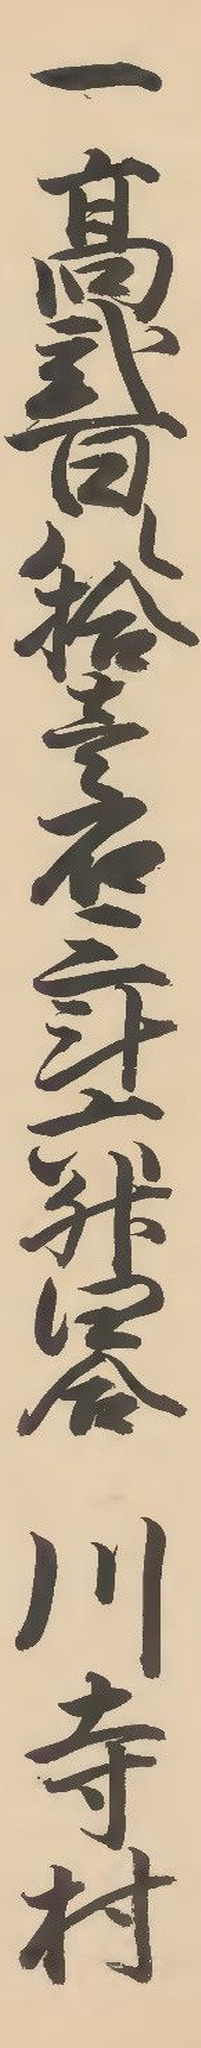一高弐百八拾壱石三斗六升四合川寺村
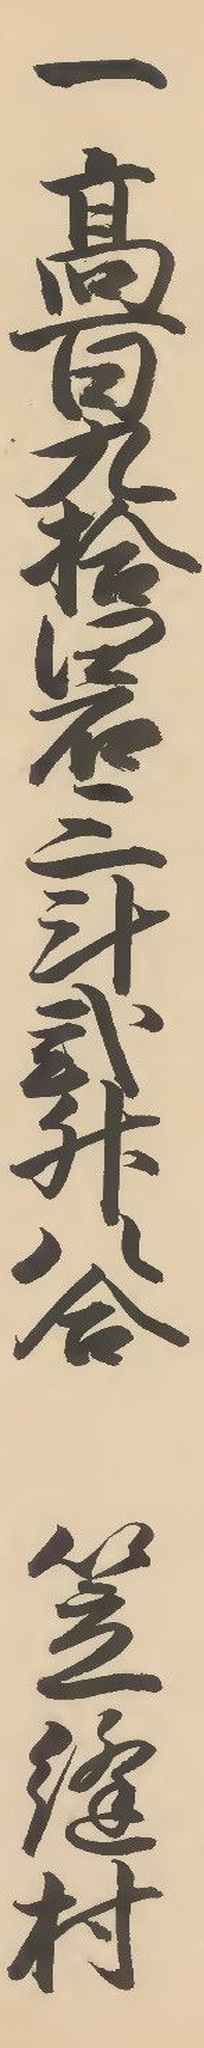一高百九拾四石三斗弐升八合笠縫村
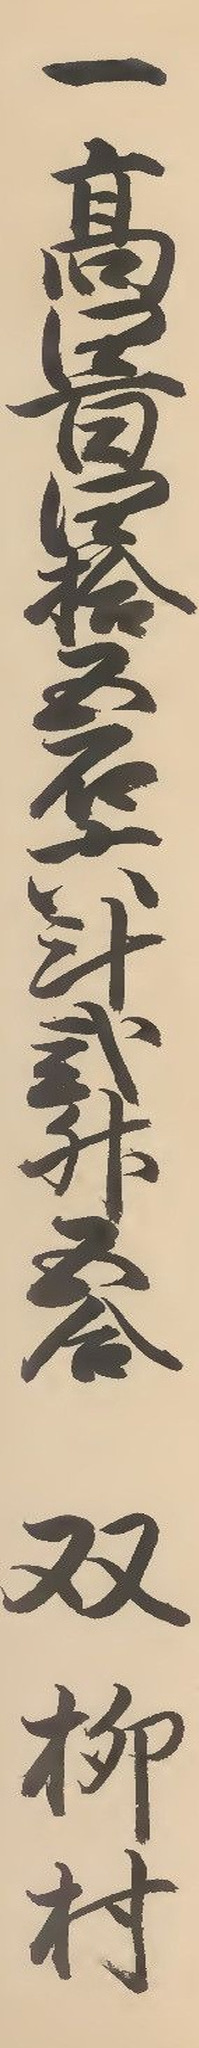一高四百四拾五石六斗弐升五合双柳村
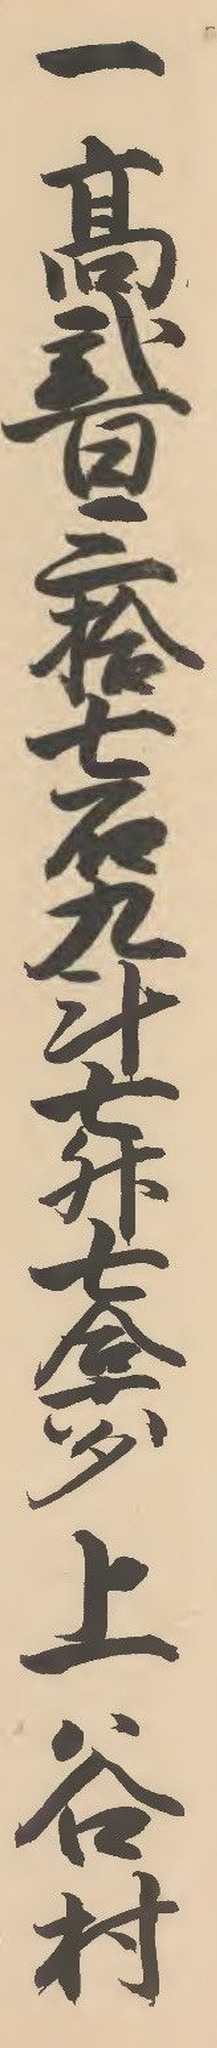一高弐百三拾七石九斗七升七合六勺上谷村
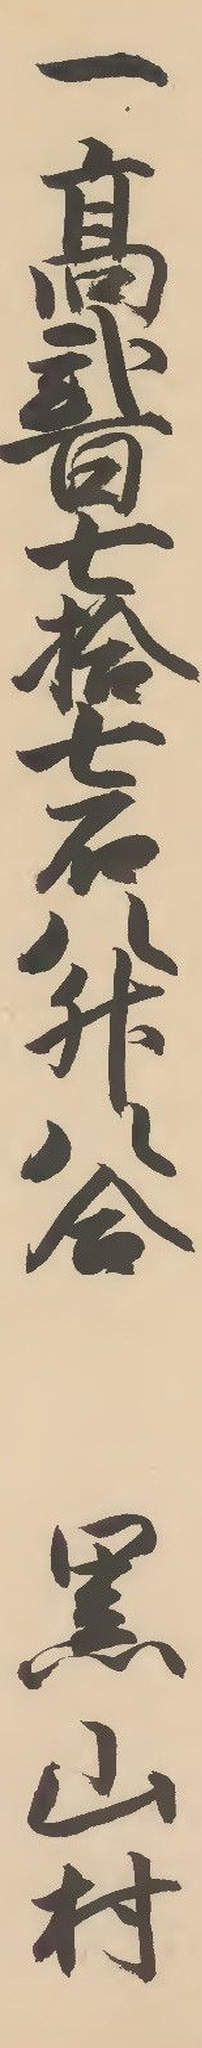一高弐百七拾七石八升八合黒山村
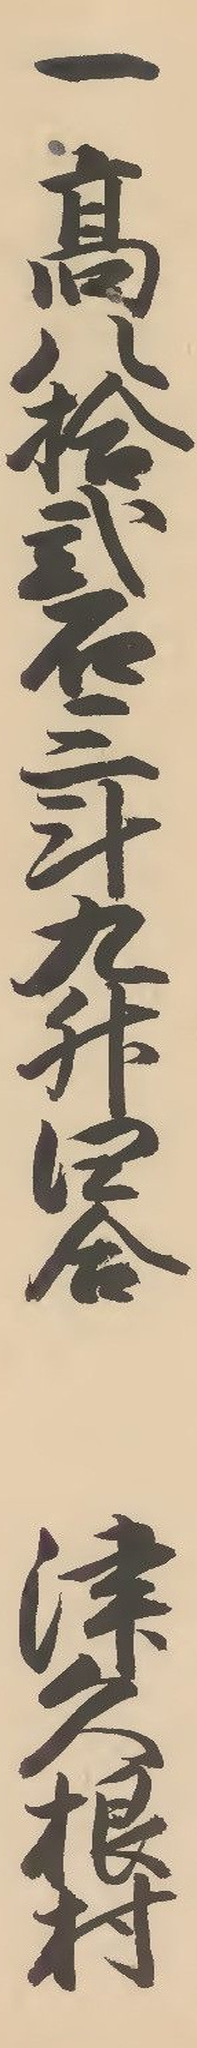一高八拾弐石三斗九升四合津久根村

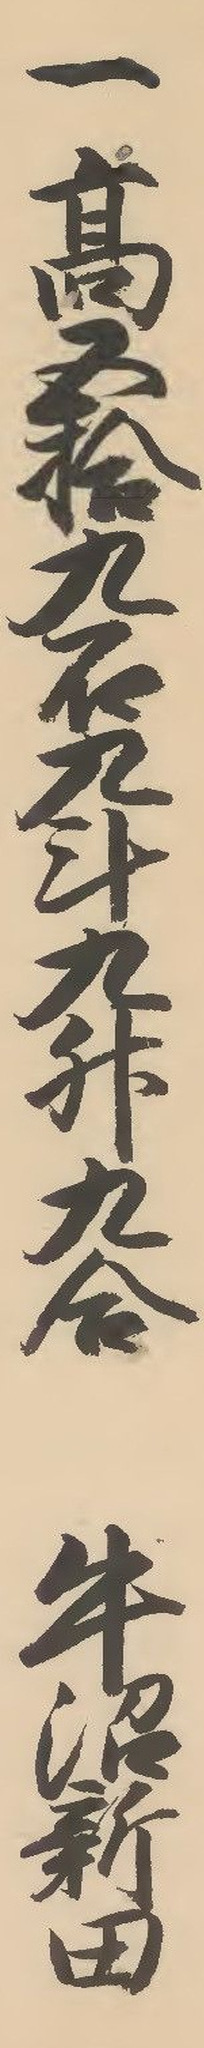一高五拾九石九斗九升九合牛沼新田
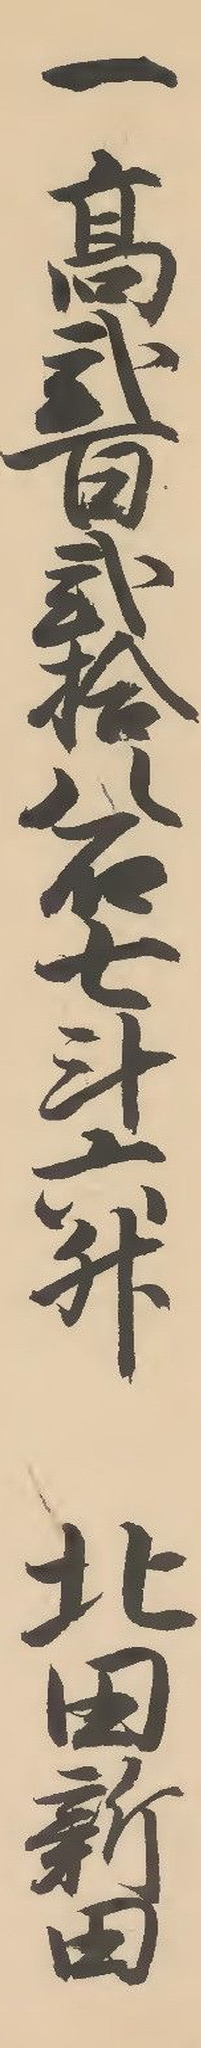一高弐百弐拾八石七斗六升北田新田
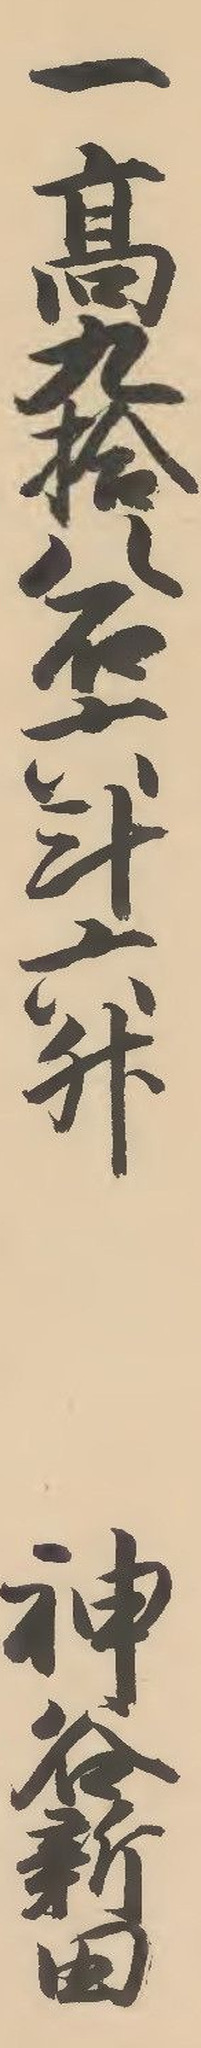一高九拾八石六斗六升神谷新田
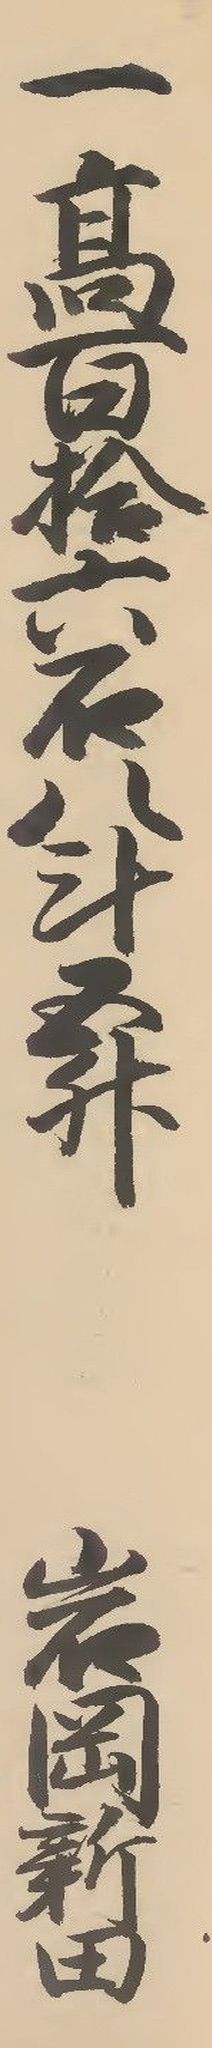一高百拾六石八斗五升岩岡新田
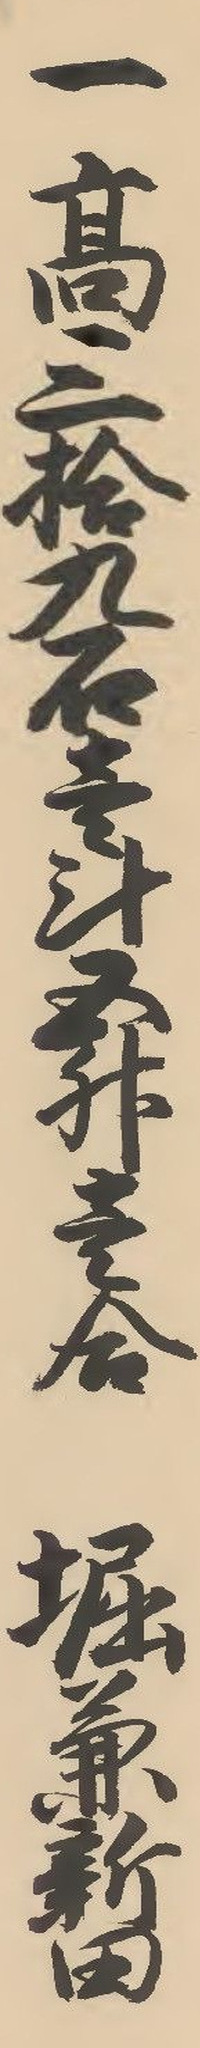一高三拾九石壱斗五升壱合堀兼新田
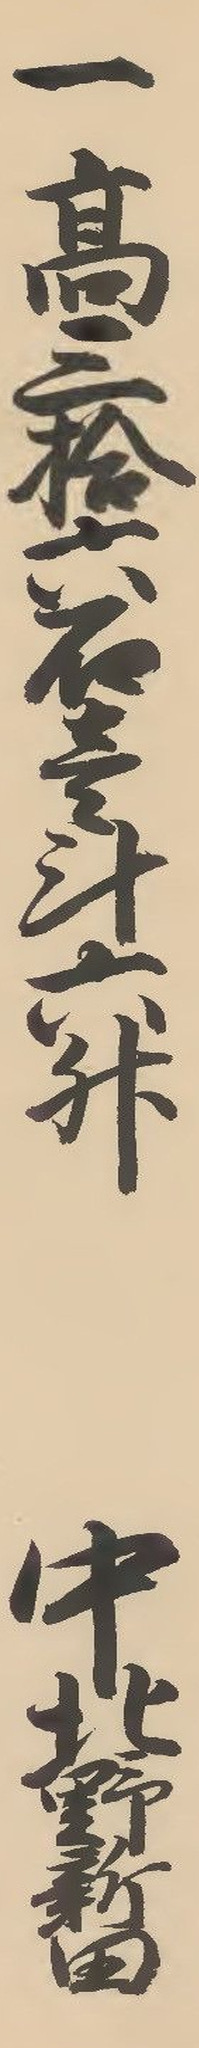一高三拾六石壱斗六升中北野新田
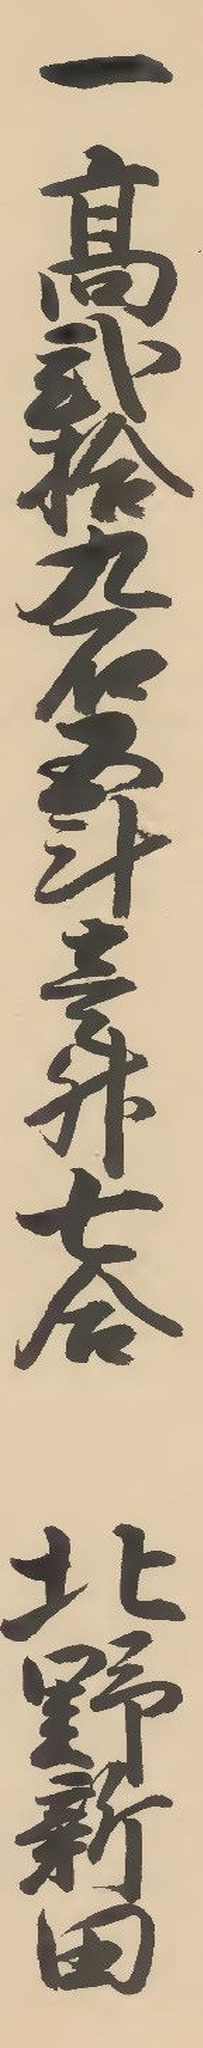一高弐拾九石五斗壱升七合北野新田
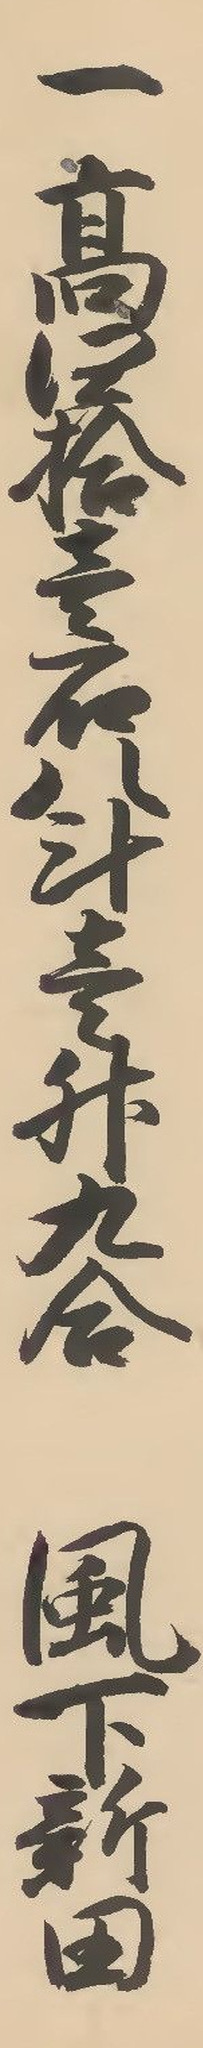一高四拾壱石八斗壱升九合風下新田
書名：武蔵国郷帳　上
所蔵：国立公文書館 National Archives of Japan
